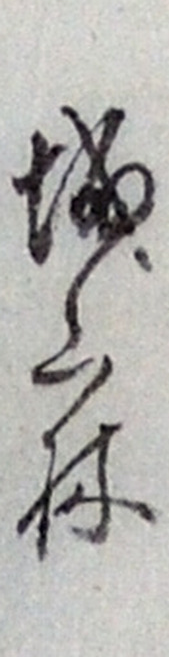城山林
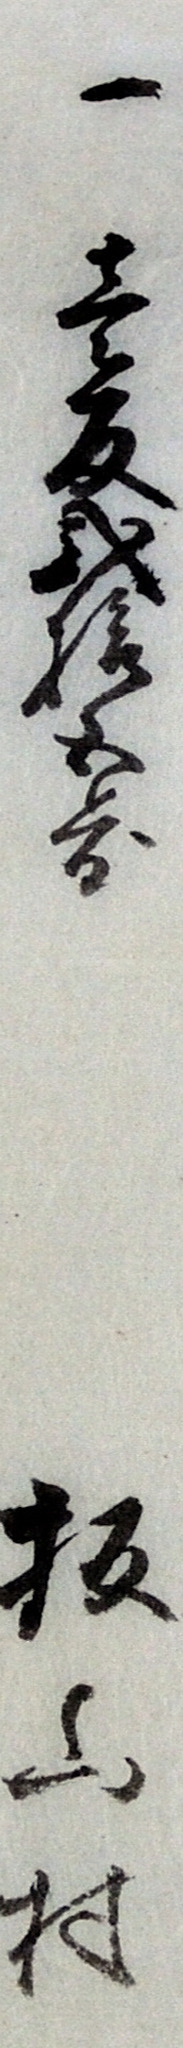一壱反弐拾五歩板山村
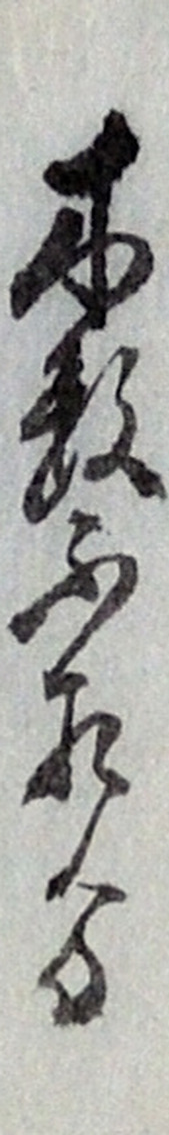木数不相分
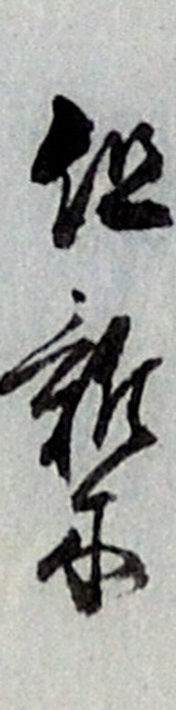但雑木
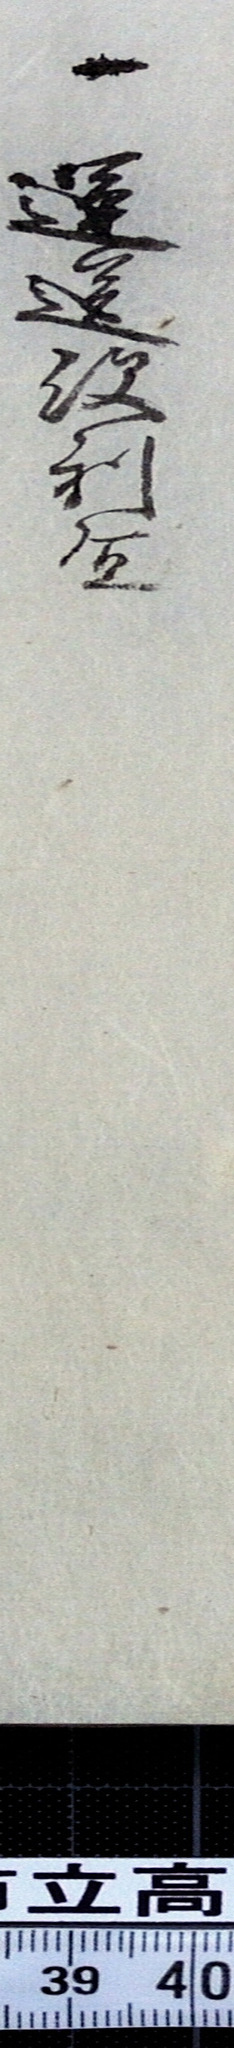一運送便利宜
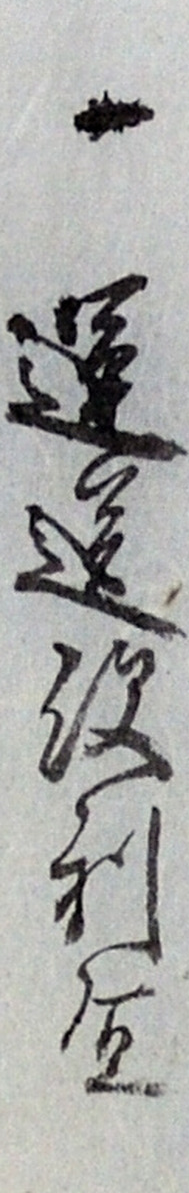一運送便利宜
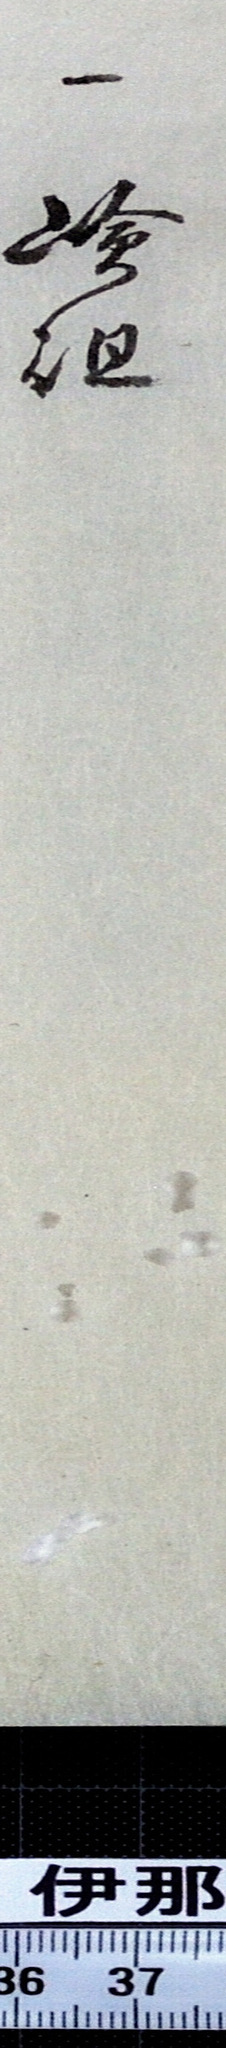一嶮岨
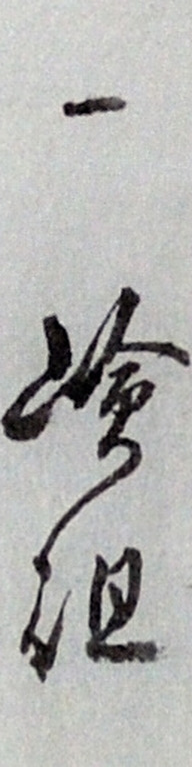一嶮岨

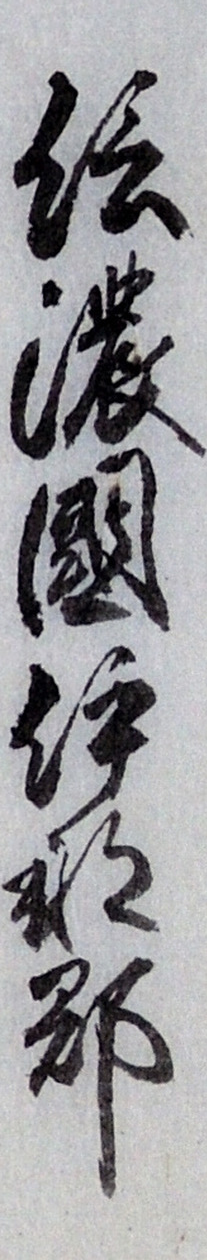信濃国伊那郡
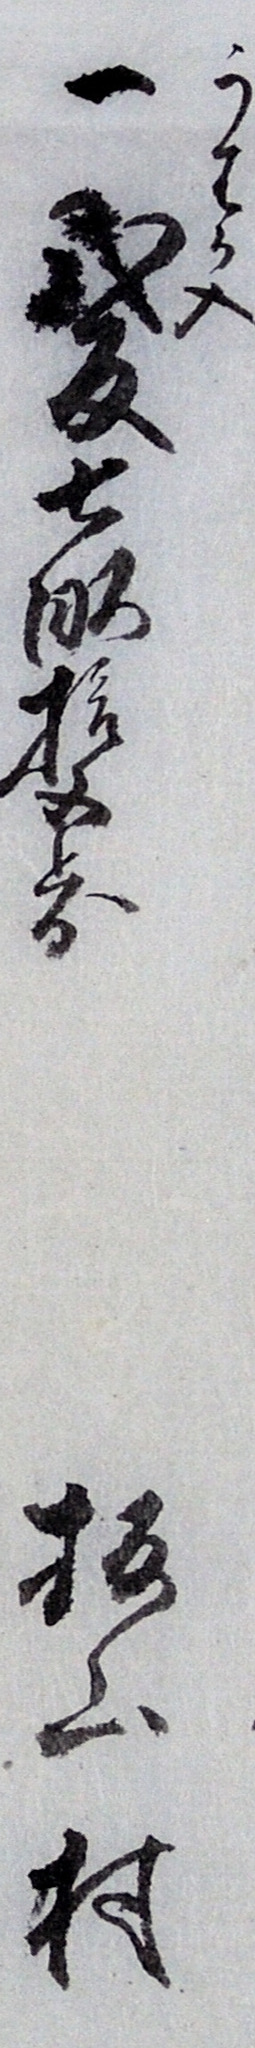一弐反七㽗拾五歩板山村
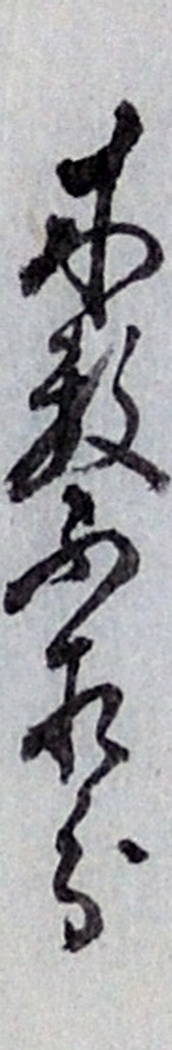木数不相分
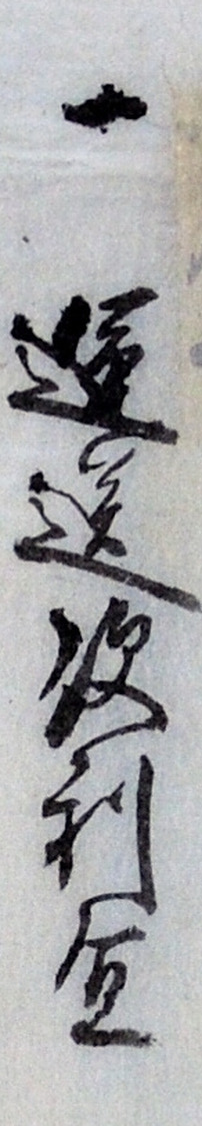一運送便利宜
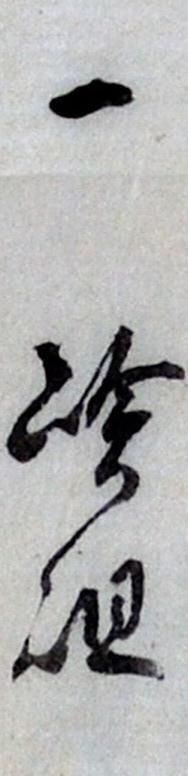一嶮岨
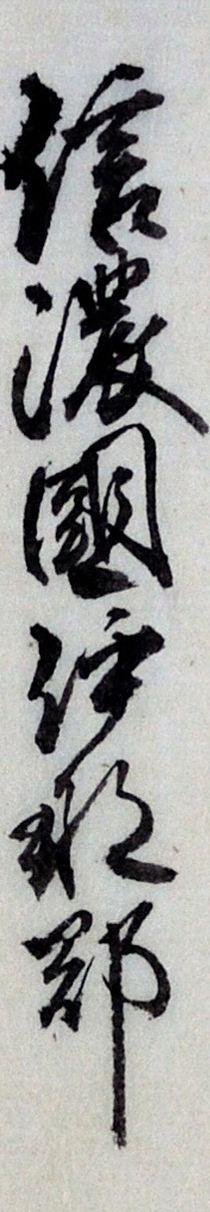信濃国伊那郡
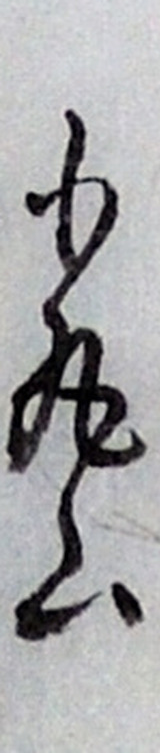小丸山
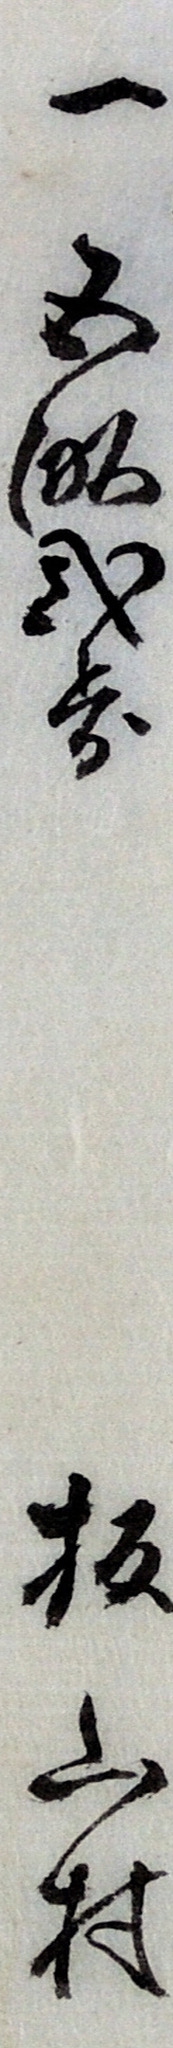一五㽗弐歩板山村
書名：官林反別帳
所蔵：伊那市立高遠町図書館・合同会社AMANE
